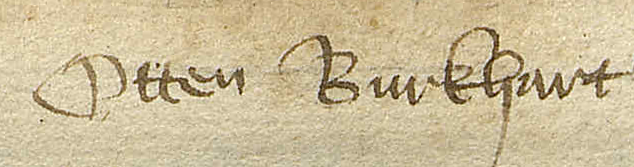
Otten Burkhart
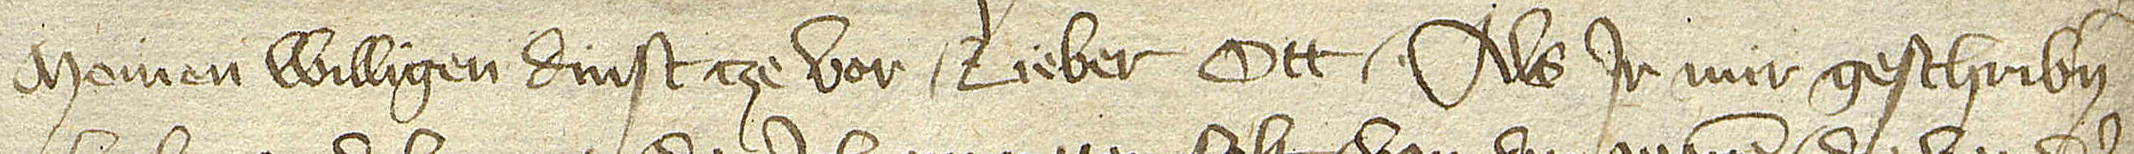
Meinen willigen dinſt cʒe vor / Lieber Ott / . Als Ir mir geſchribn*
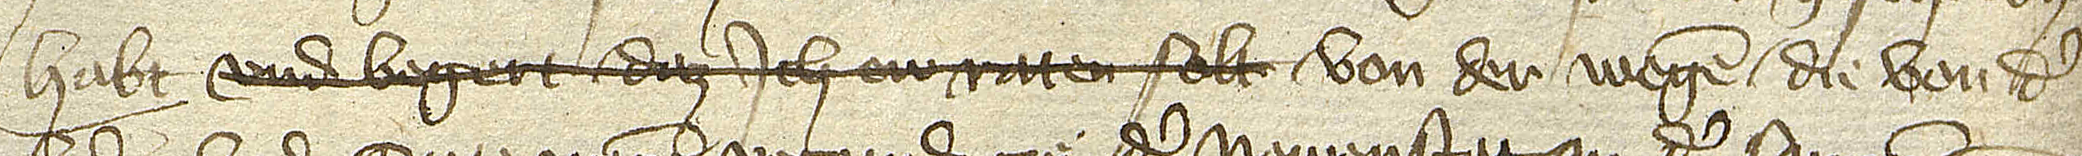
habt vnd begert / daʒ Ich ew raten ſolt / von der wege* / die von d*
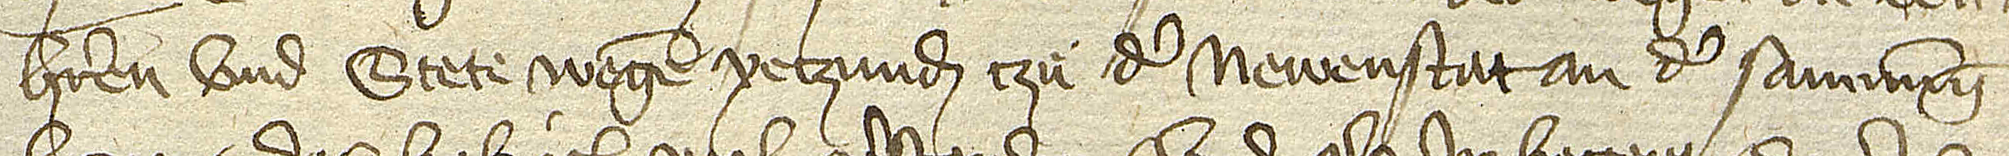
hr*en vnd Stete wege* yecʒund* cʒü / d* Newenſtat an d* ſamnug*
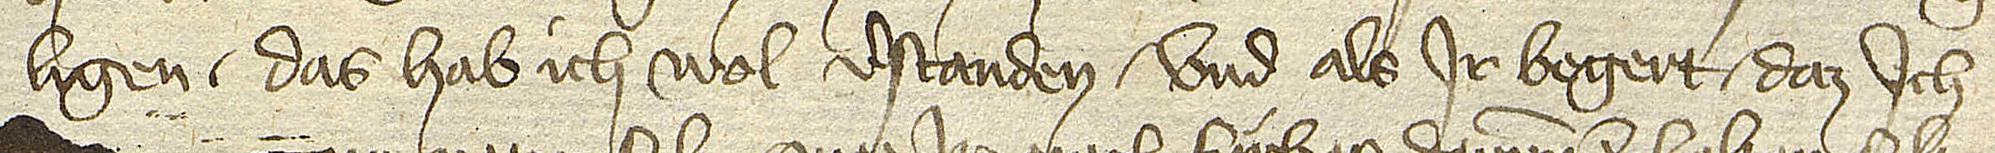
ligen / das hab ich wol v*ſtanden / vnd als Ir begert / daʒ Ich
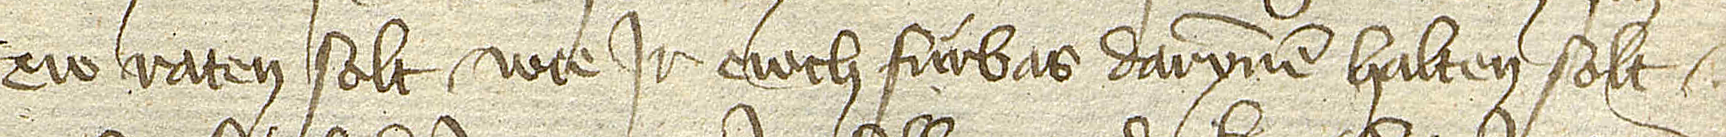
ew raten ſolt / wie Ir ewch fürbas dary*ne* halten ſolt / .
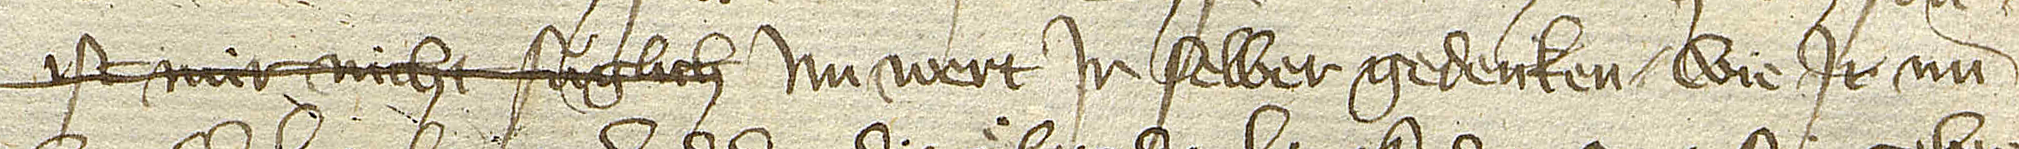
iſt mir nicht füglich Nu wert Ir ſelber gedenken / wie Ir nu
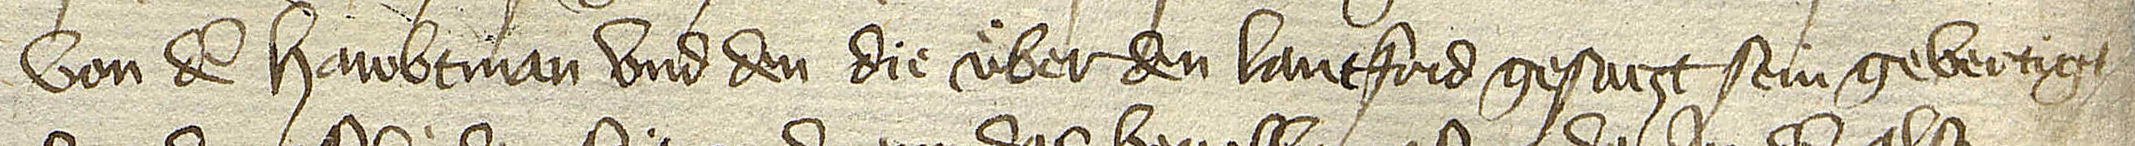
von de* hawbtman vnd den die v̈ber den lantfrid geſacʒt ſein gevertigt
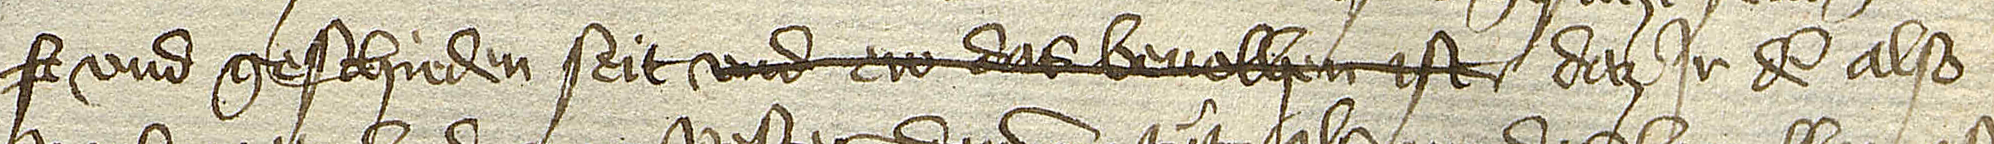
fr vnd geſchieden ſeit vnd ew das beuolhen iſt / daʒ Ir de* alſo
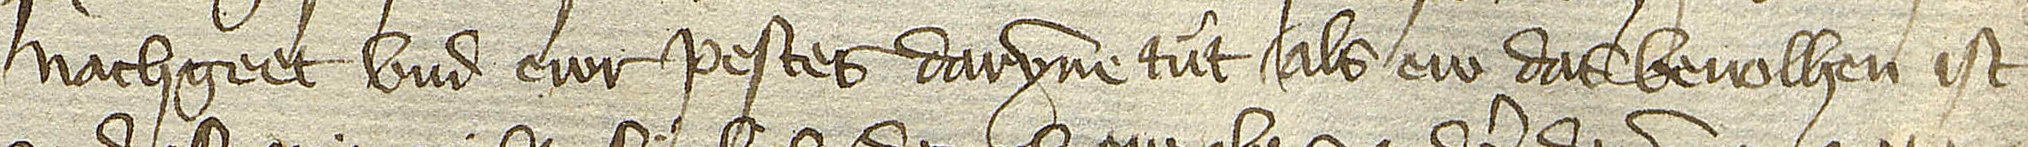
nachgeet vnd ewr peſtes daryn*e tüt / als ew das beuolhen iſt
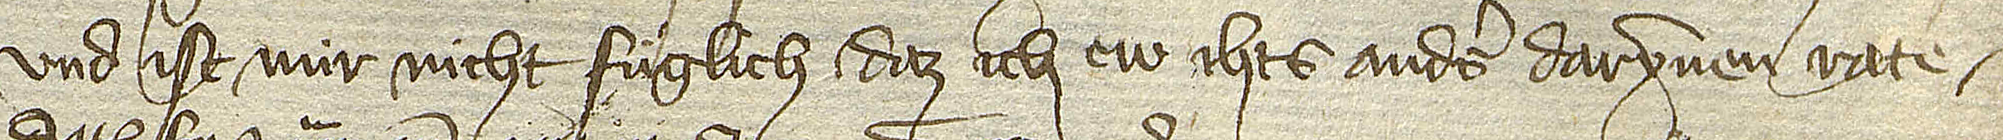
vnd iſt mir nicht füglich / daʒ ich ew ihts ands* daryn*en rate /
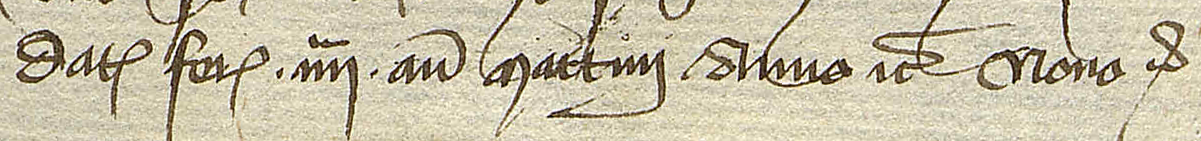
dat fer* . iiii* . an* Martini / Anno ec* Nono * §
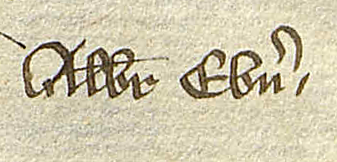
Albr* Ebn*/
